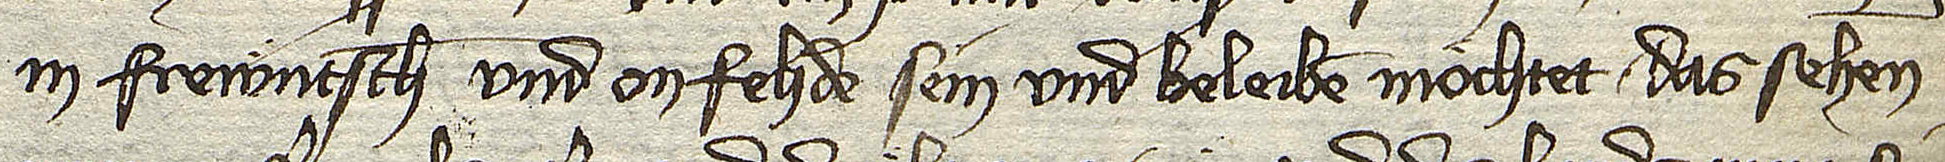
in freẅntſch* vnd on fehde ſein vnd beleibe* möchtet / das ſehen
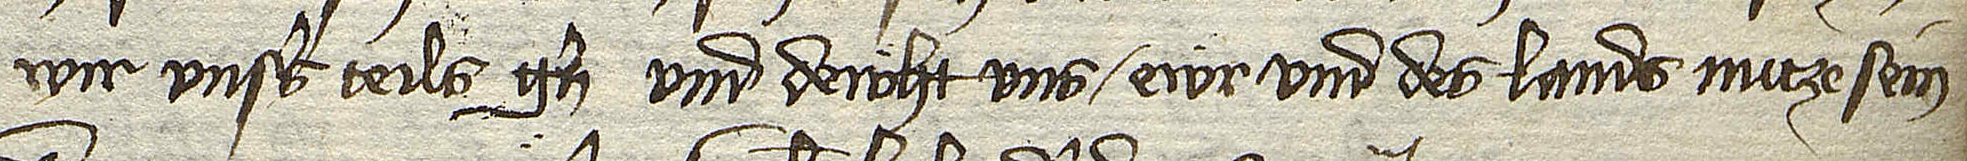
wir vnſ*s teils g*n vnd deẅht vns / eẅr vnd des lands nucʒe ſein
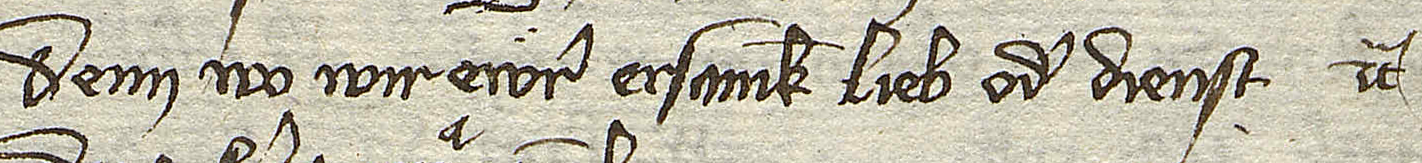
Denn wo wir eẅr* erſamk* lieb od* dienſt ec*
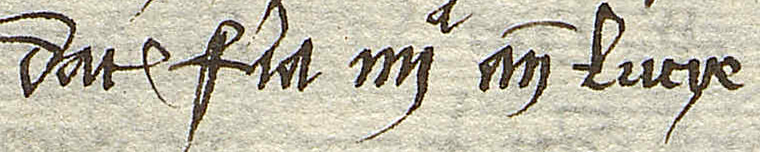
Dat* fi*a iiii* an* lucye
